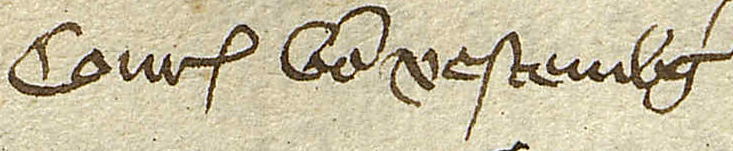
Conr* vo* veſtembg*
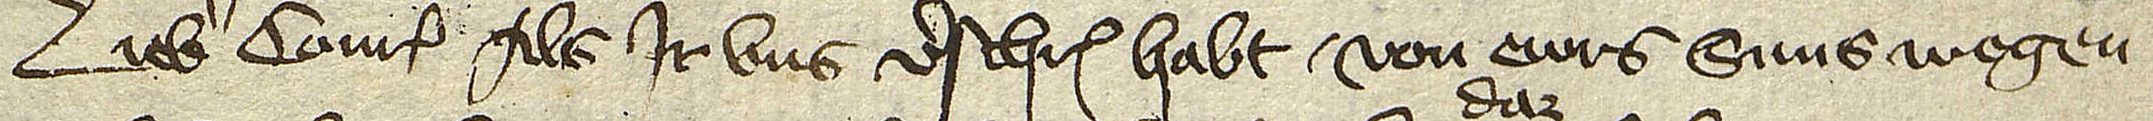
Lieb* Conr* Als Ir vns v*ſchr* habt / von ewrs Suns wegen
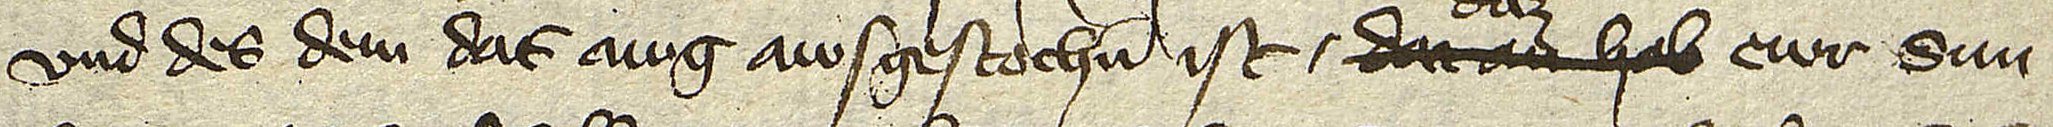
vnd des dem das awg awſgeſtochn* iſt / daran hab ewr Sun
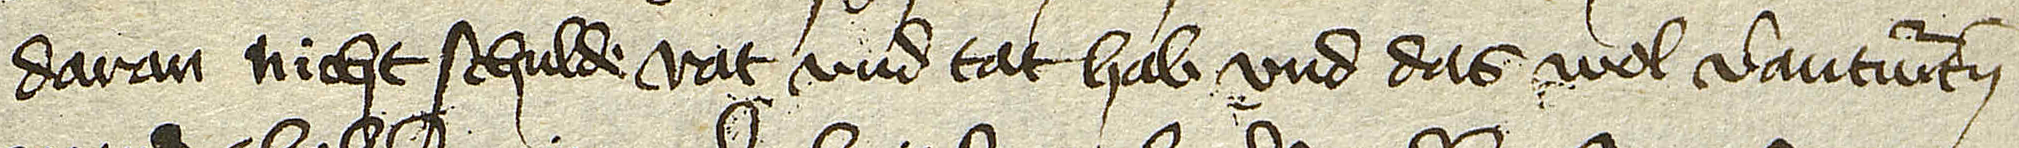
daran nicht ſchulde rat vnd tat hab vnd das wol v*antwt*n*
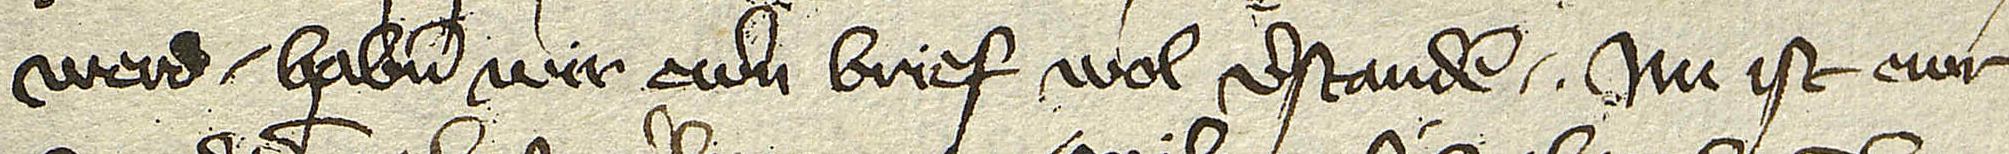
werd / habn* wir ew*n brief wil v*ſtande* / . Nu iſt ewr
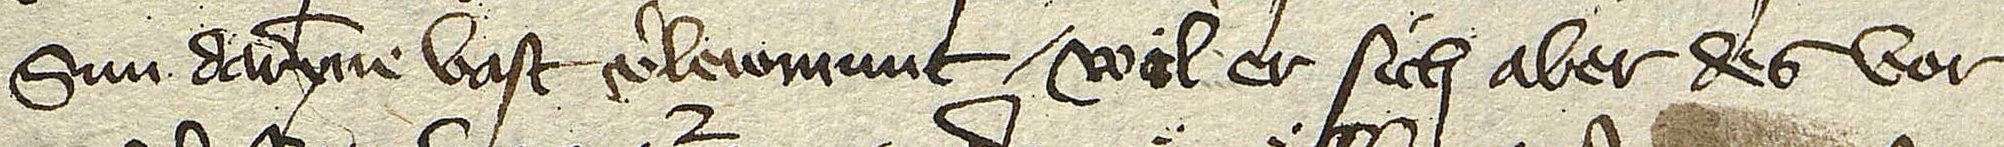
Sun daryne* vaſt v*lewmunt / wil er ſich aber des vor
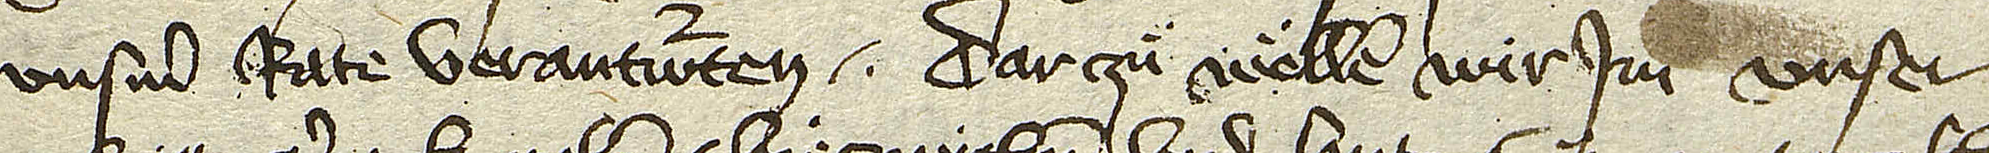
vnſm* Rate verantwt*en / . Darcʒü wölle* wir Im vnſer
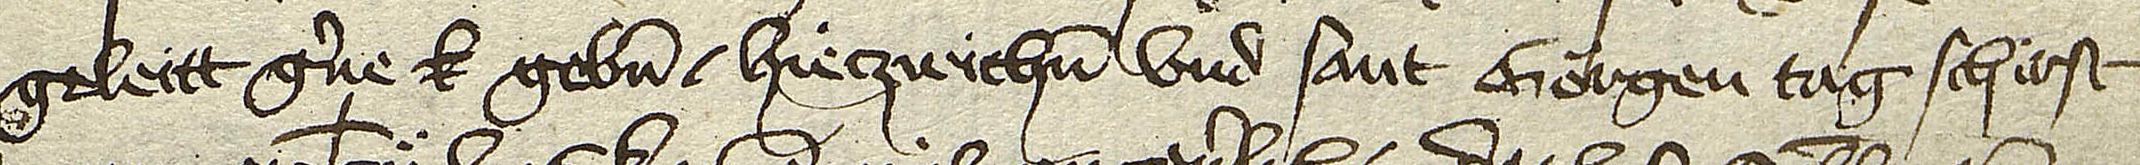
geleitt g*ne k gebn* / hiecʒwichn* vnd ſant Görgen tag ſchirſt
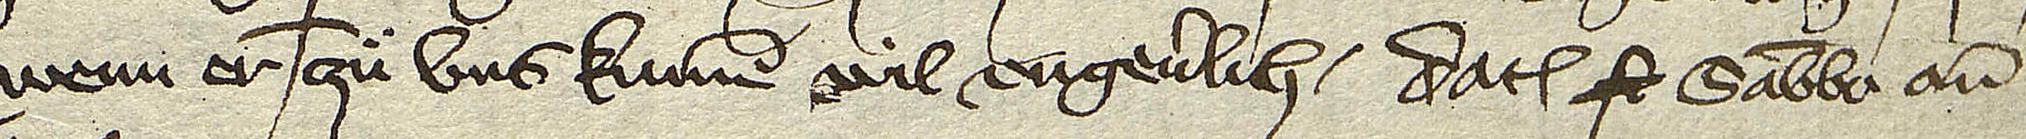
wenn er cʒü vns kume* wil vngeu*lich / Dat* fi Sabbo* an*
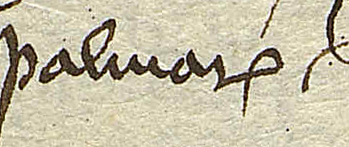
palma* /
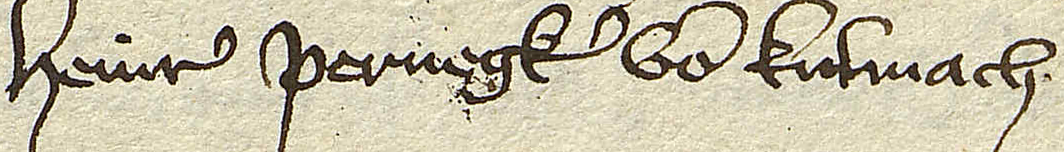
heinr* Pernegk* vo* kulmach
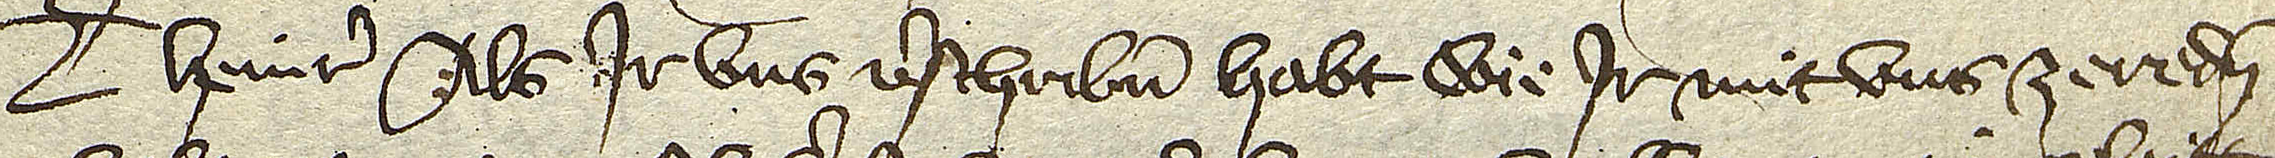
L* heinr* Als Ir vns v*ſchribn* habt wie Ir mit vns cʒeredn*
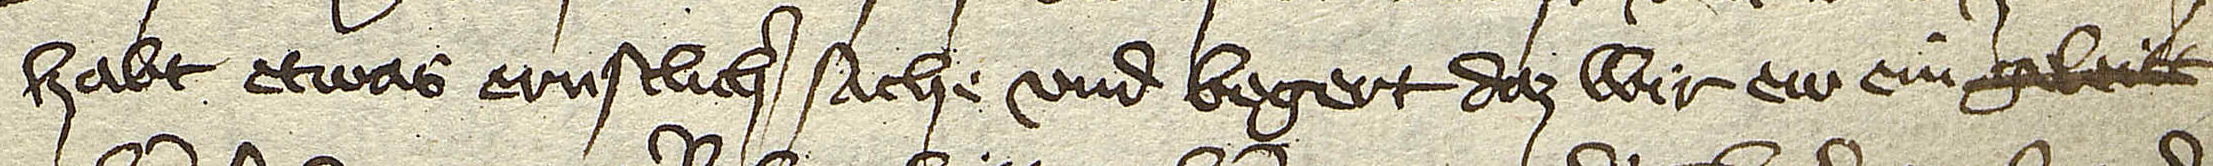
habt etwas ernſtlich* ſache vnd begert daʒ wir ew ein geleitt
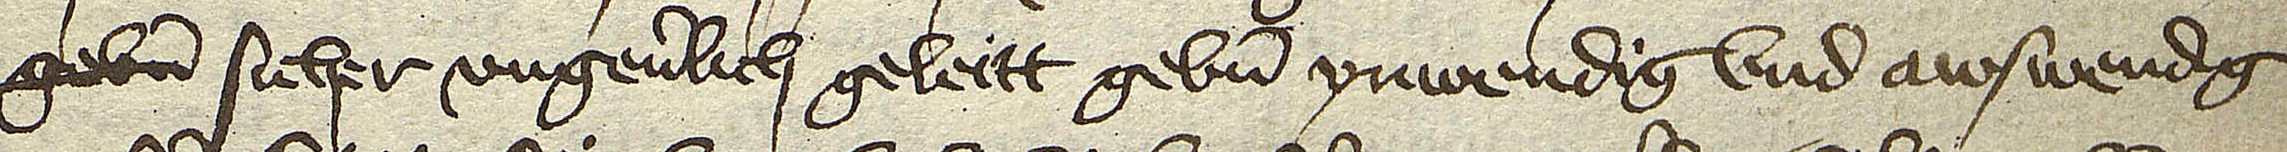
gebn* ſicher vngeu*lich geleitt gebn* ynwendig vnd awſwendig
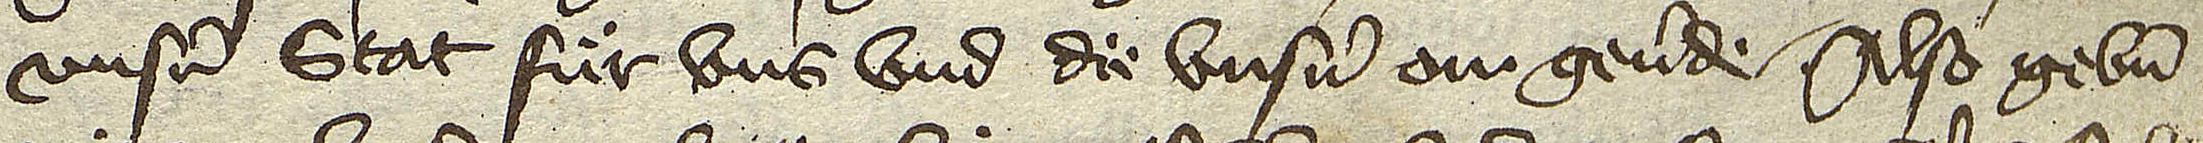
vnſr* Stat für vns vnd die vnſn* on geu*de / . Alſo gebn*
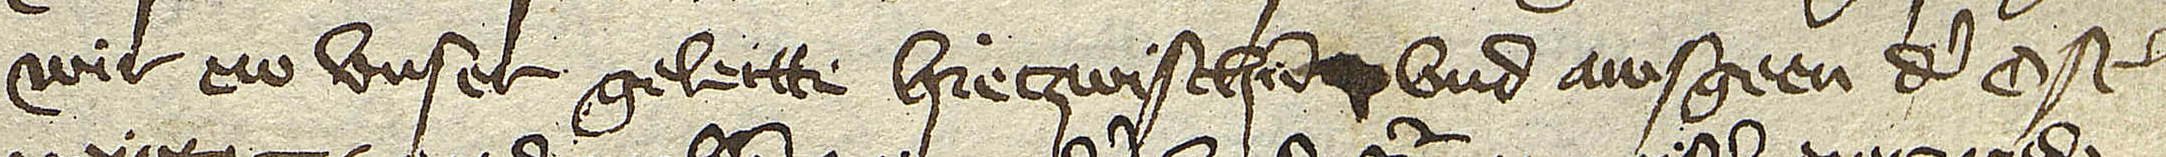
wir ew vnſer geleitte hiecʒwiſchn* vnd awſgeen d* Oſt*
